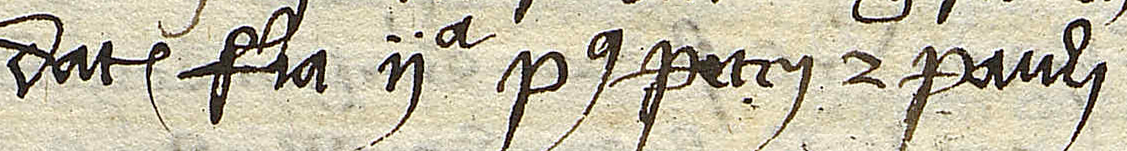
Dat* fia* ii* p* Petri @ Pauli
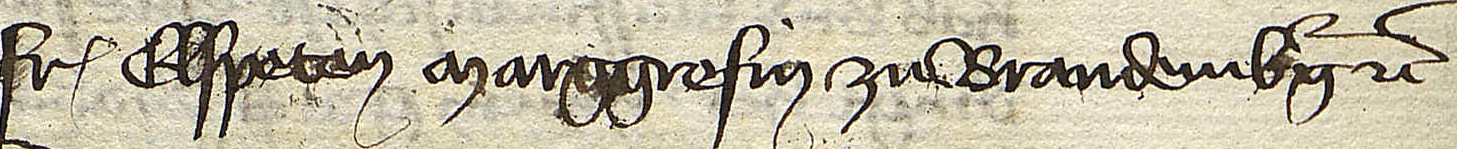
Fr* Elſpeten Marggrefin cʒu Brandemb*g ec*
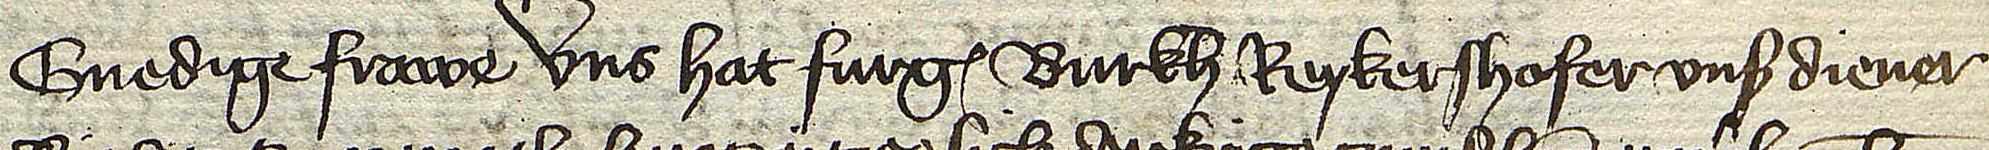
Gnedige* frawe Vns hat furg* Burkh* Reykerſhofer vnſ* diener
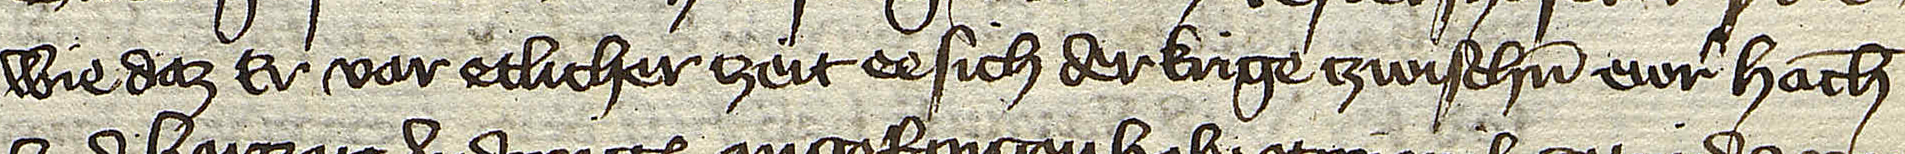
wie daʒ Er vor etlicher cʒeit ee ſich der krige cʒwiſch*n ew*r hoch*
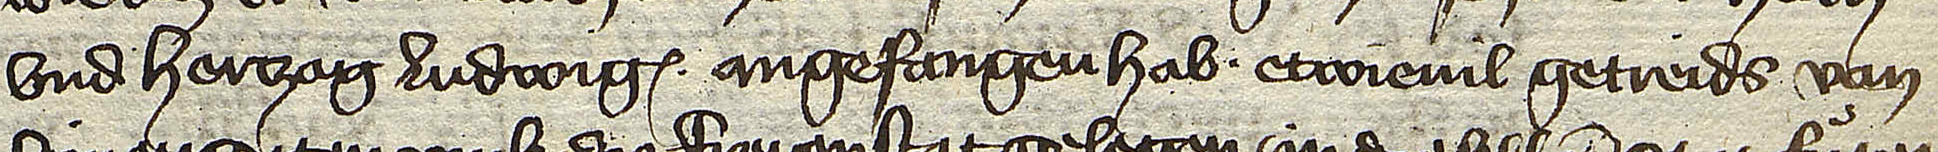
vnd hercʒog ludwig* . angefangen hab . etwieuil getreids von
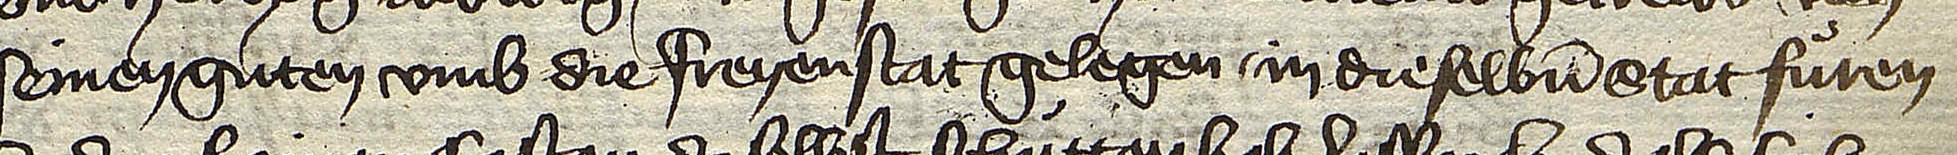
ſeinen guten vmb die Freyenſtat gelegen / in dieſelb*n Stat füren
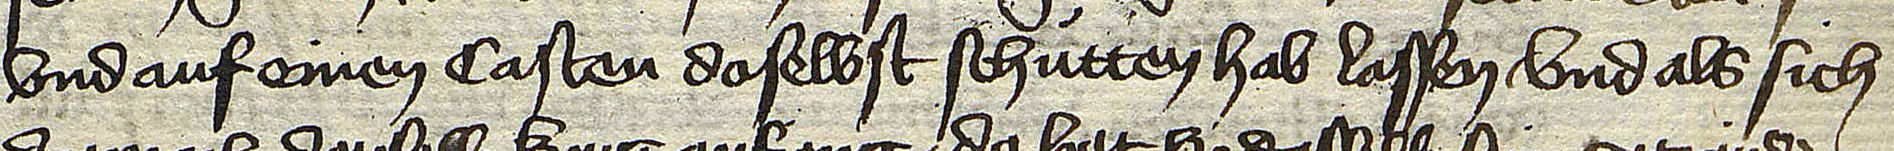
vnd auf einen Caſten daſelbſt ſchütten hab laſſen / vnd als ſich
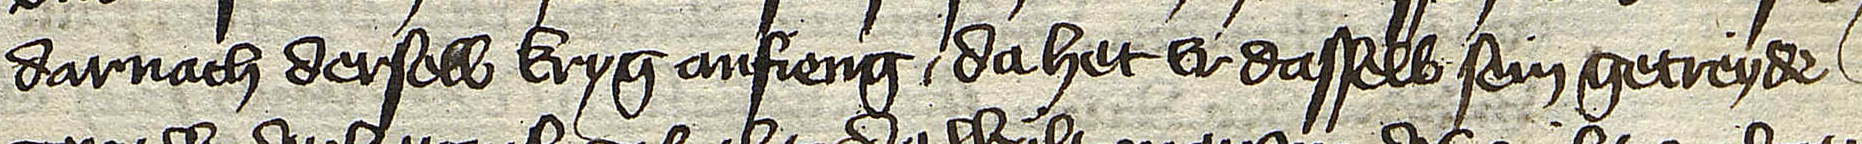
darnach derſelb kryg anfieng / da het er daſſelb ſein getreyde
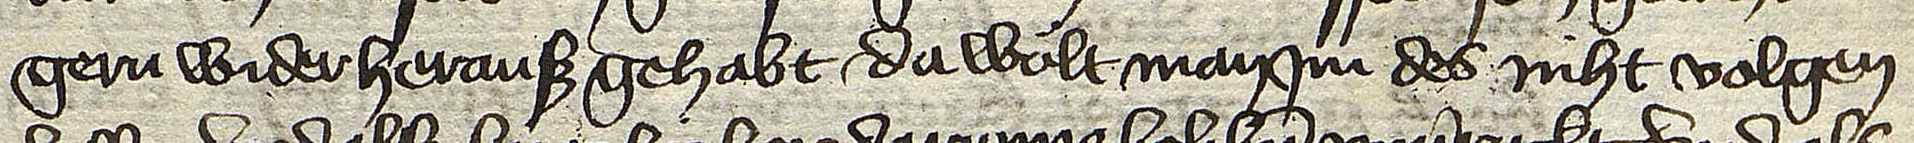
gern wider herauſʒ gehabt / da wölt man Im des niht volgen
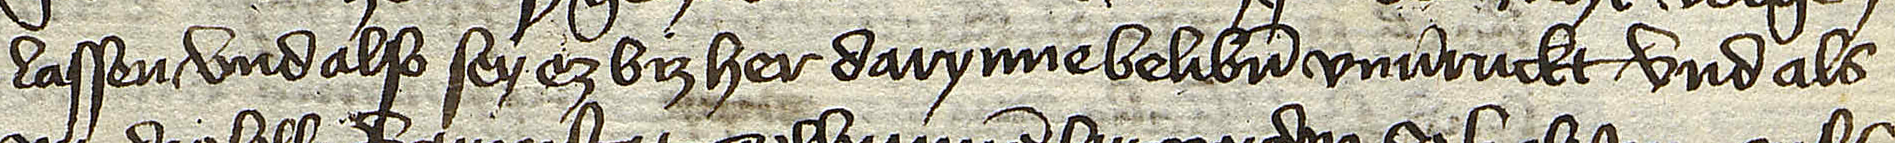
laſſen / vnd alſo ſey eʒ biʒ her darynne belibn* vnu*ruckt / vnd als
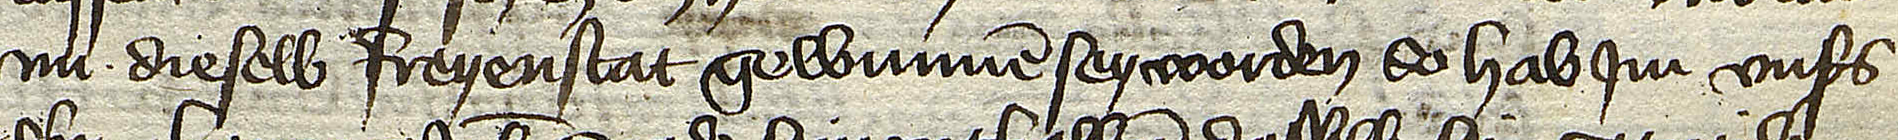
nu . dieſelb Freyenſtat gewunne* ſey worden So hab Im vnſ*s
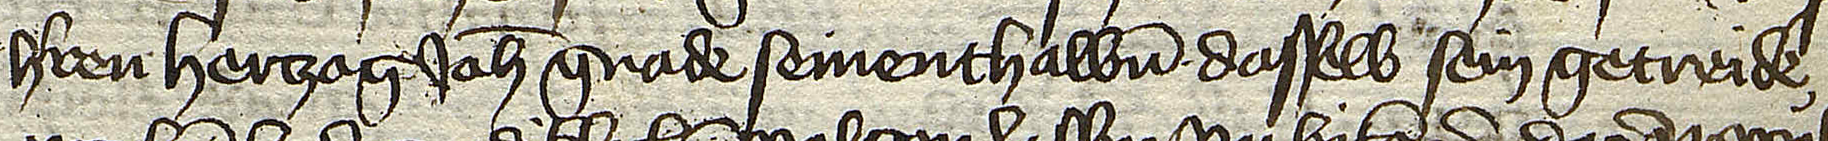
h*ren Hercʒog Ioh* gnade ſeinenthalb*n . daſſelb ſein getreide
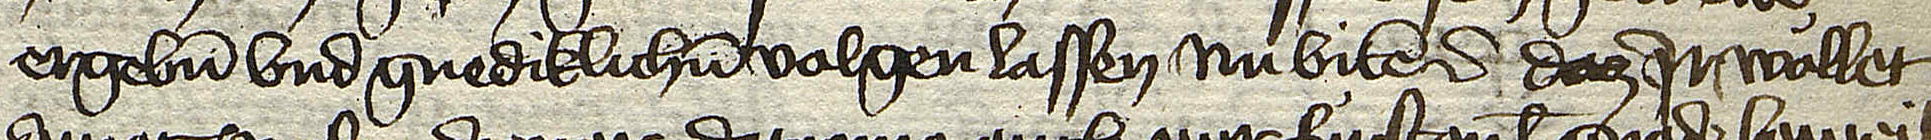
ergeb*n vnd gnediklich*n volgen laſſen / Nu bite* ec* daʒ Ir wöllet
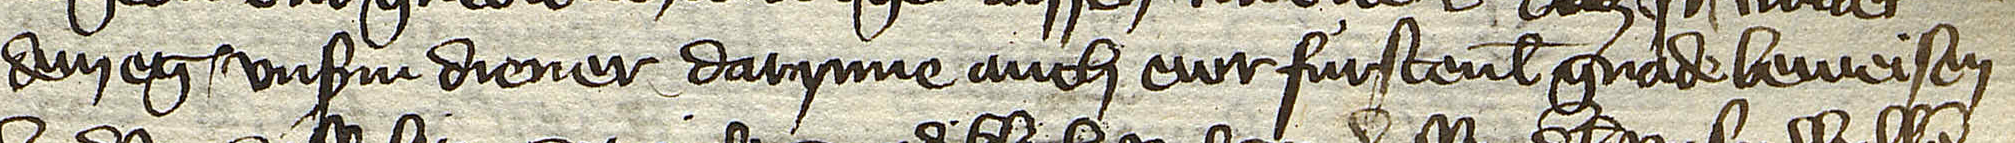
dem eg* vnſ*m diener darynne auch ewr fürſtenl* gnade beweiſen
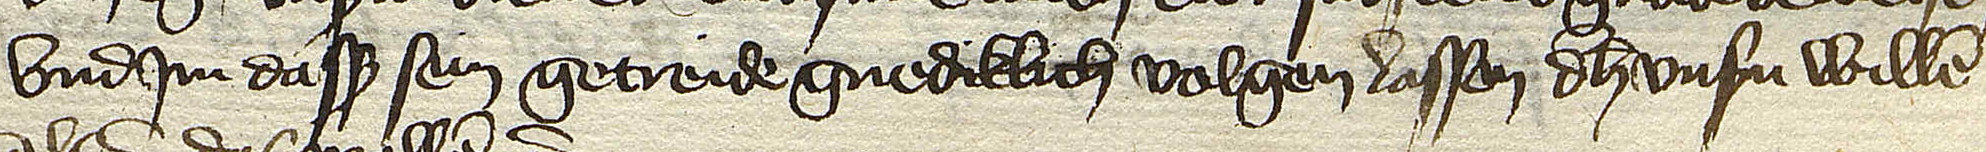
vnd Im daſſ* ſein getreide gnediklich volgen laſſen d*h vnſ*n wille*
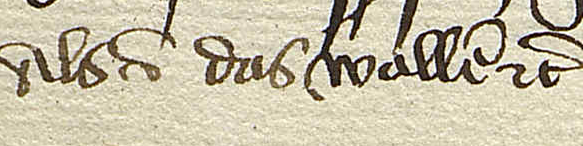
Als ec* das wölle* ec*
